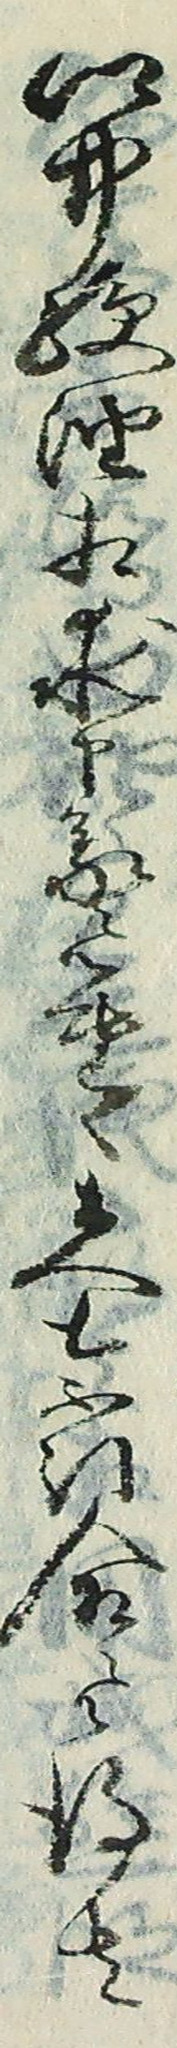郷中絞油相求申義に御坐候夫も不引合に候得者
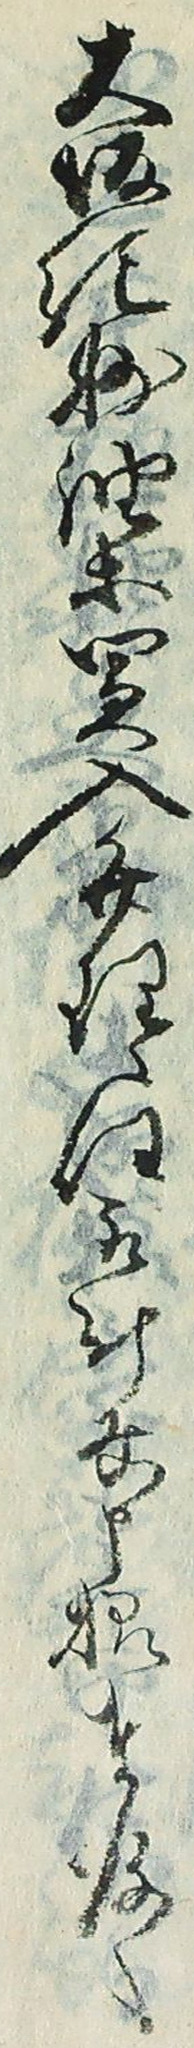大坂紀州油等買入弁理に任取計居申様奉存候
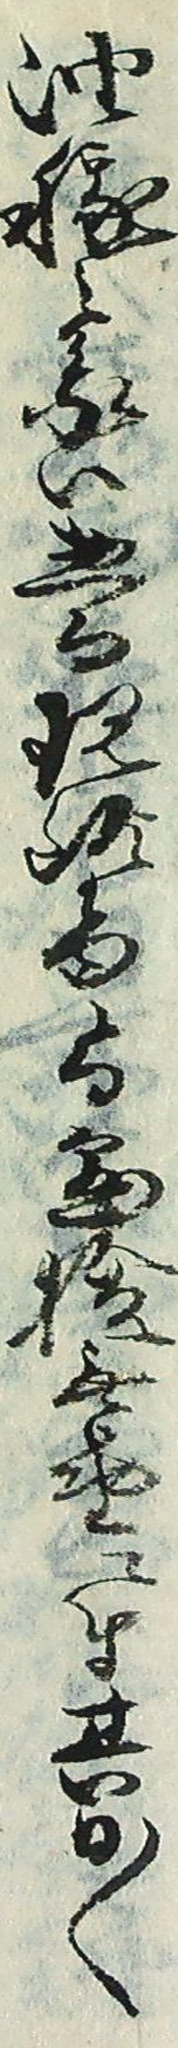油稼之義は惣而現銀商二而懸捨無御座に付其日〳〵
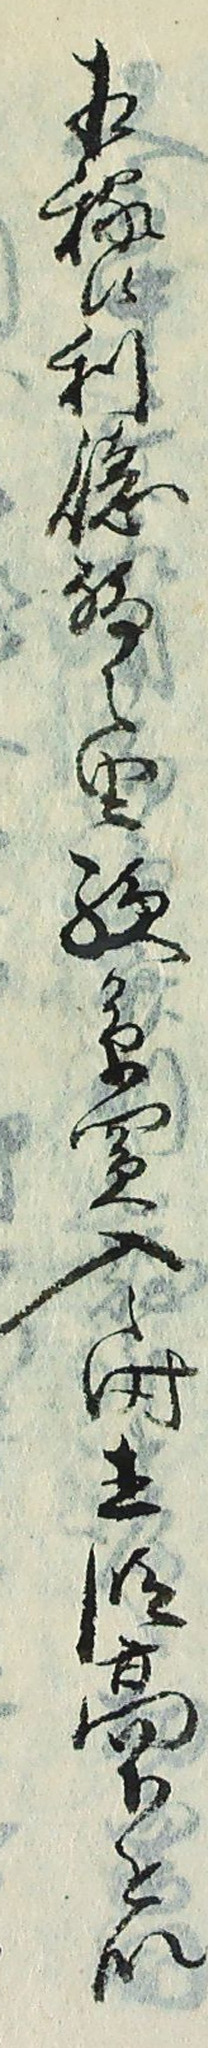相稼候利徳聊之由絞草買入之時直段高下を以
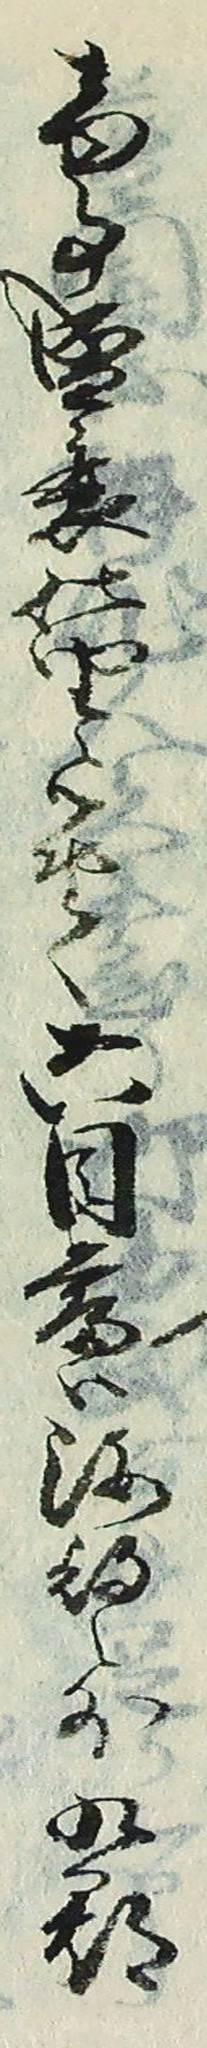商事盛衰仕由に御坐候右目当は海部之外九郡
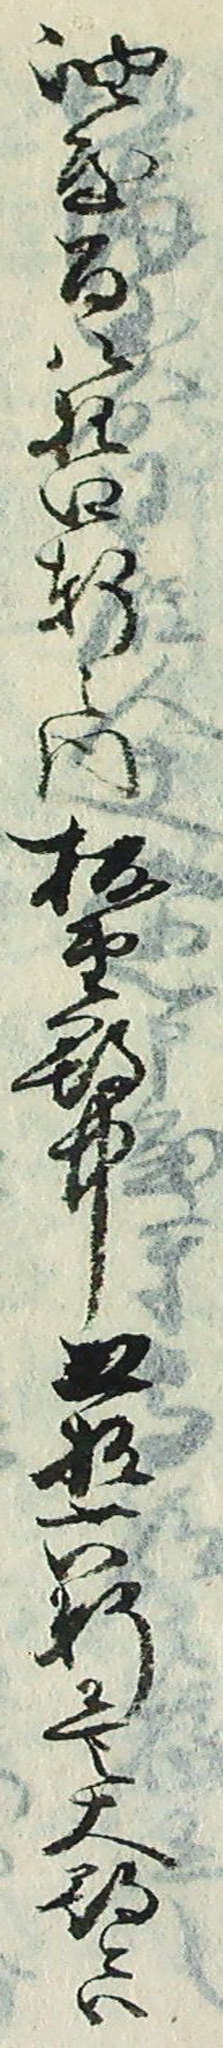油屋百八拾四軒之内板野郡中五拾六件有之大郡とは
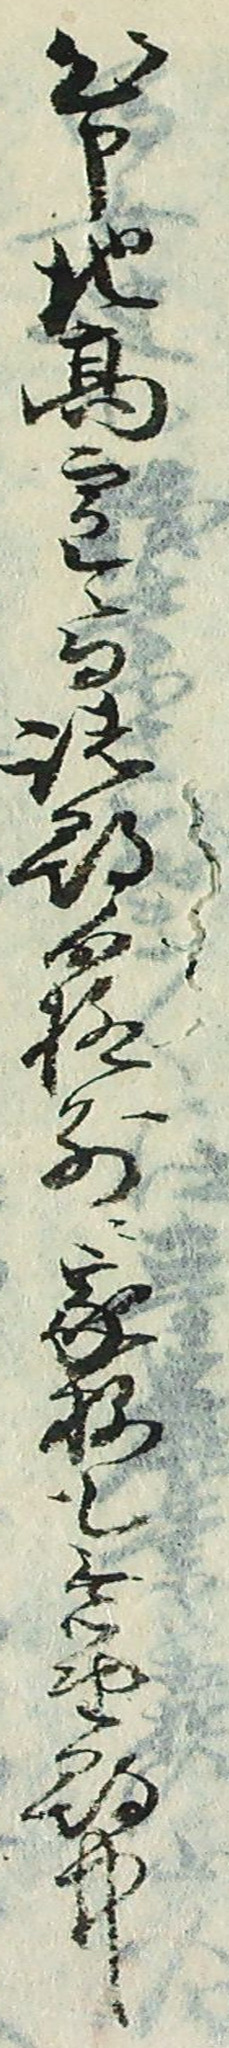乍申地高而已に而諸郡ゟ格別に家数も無御坐郡中
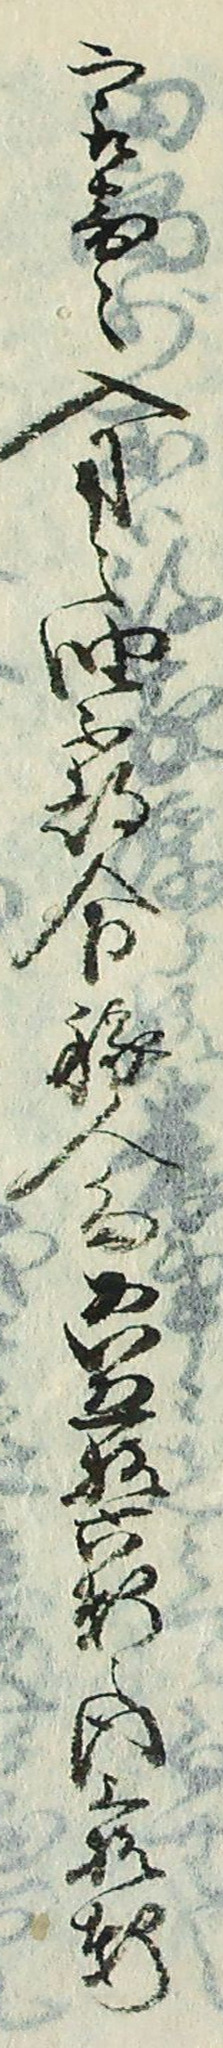最寄之入用之油不都合稼人多右五拾六軒之内三拾軒
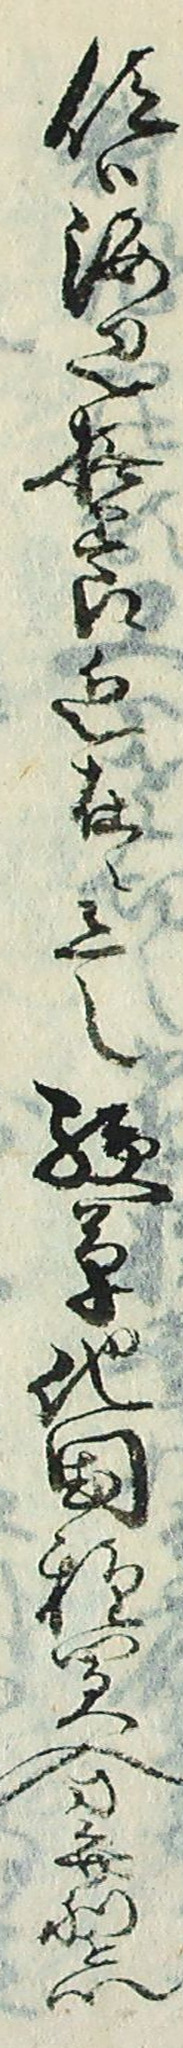位は海辺撫養近在に有之絞草他国種買入方弁利を以
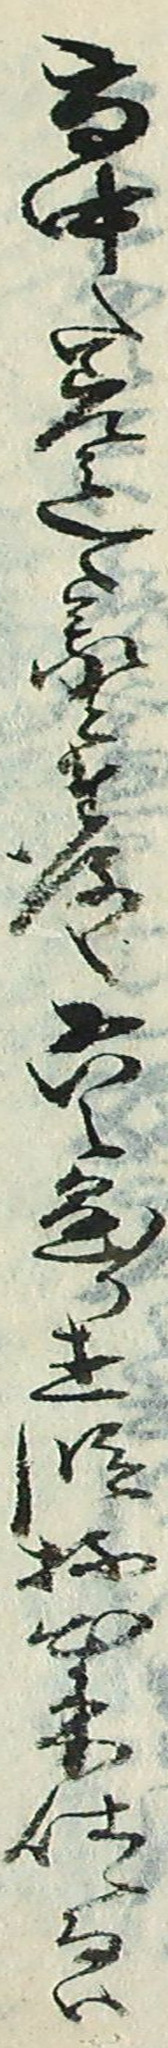市中へ差送候義と奉存候右之懸り直段抔出来仕候而は
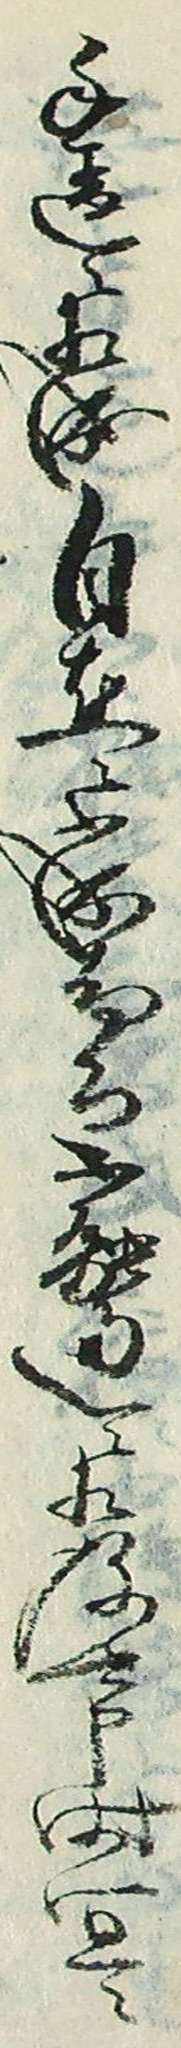手違に相成自在に不成却而不融通に相及可申時宜に
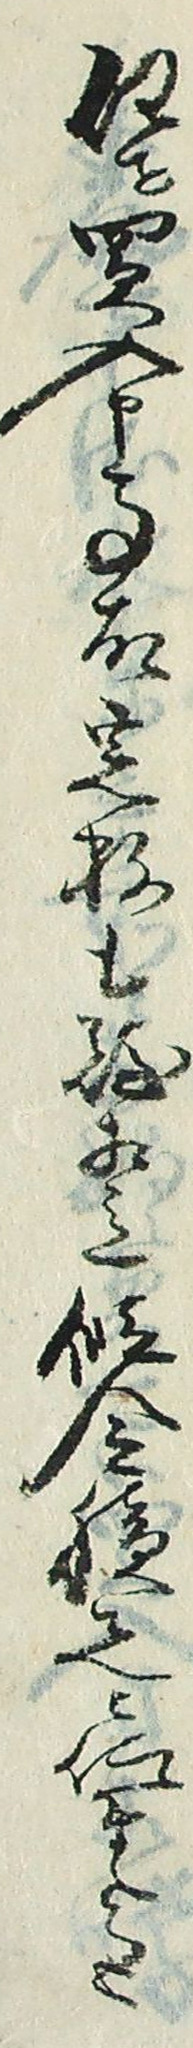任せ買入申事故定数も難相立仮令積先被仰付候とも

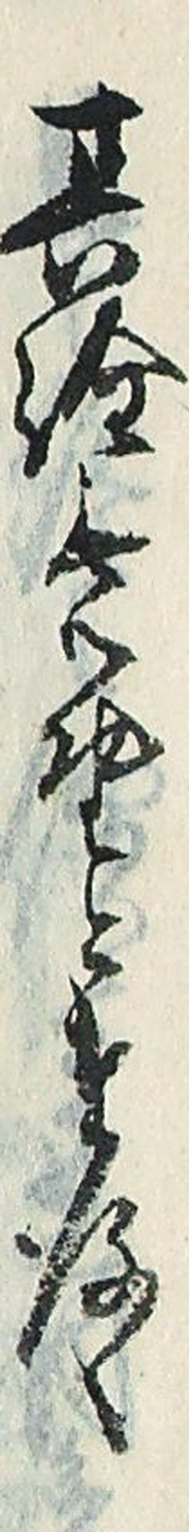其詮無御坐と奉存候
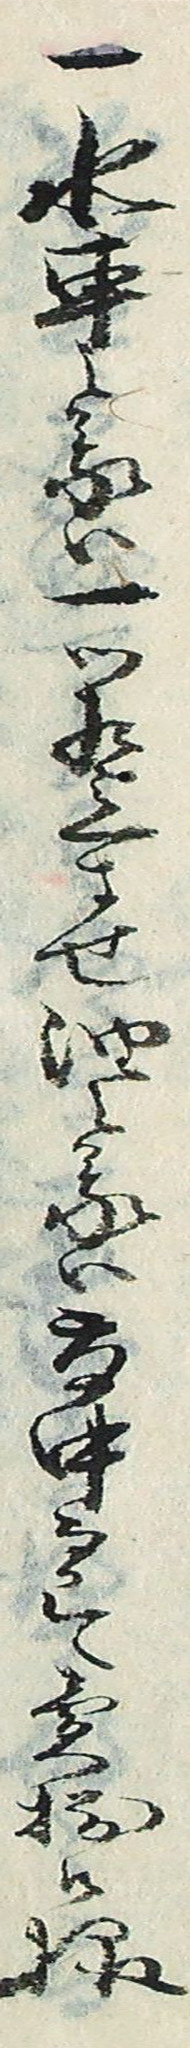一水車之義は一つ相上させ油之義は市中而已へ売捌候様
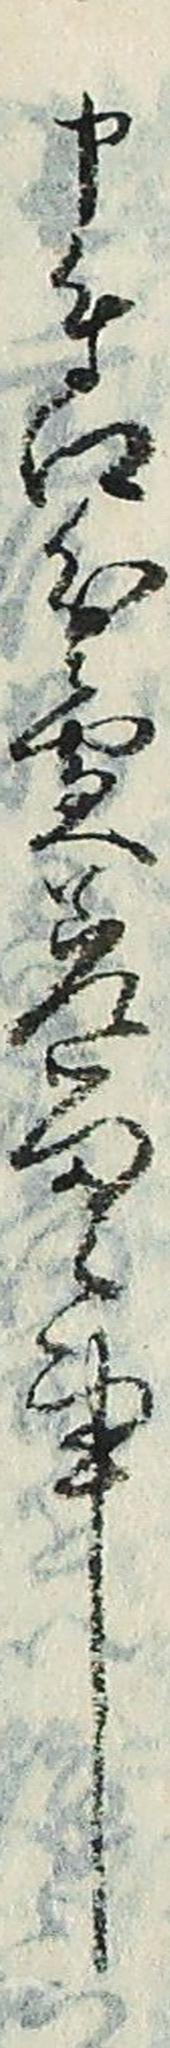申付郷分売差留候事
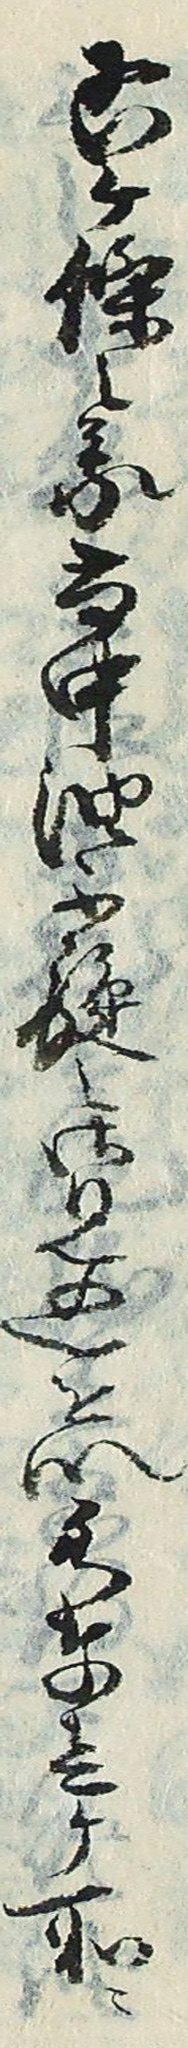右ケ條之義市中油不健之御見込を以水車壱ケ所に
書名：油稼御取究ニ附御箇條書テ以被仰渡南北同役申談御答書控
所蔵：鳴門教育大学 Naruto University of Education
